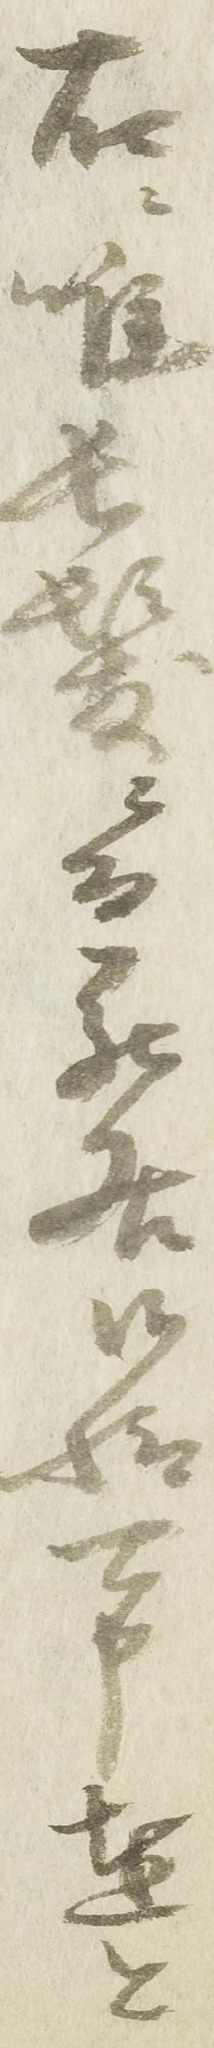右ニ准長髪ニ而罷居候様可申達と
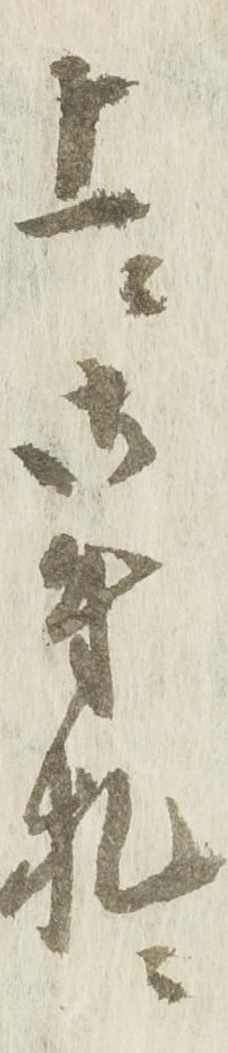上ニ御付札ニ
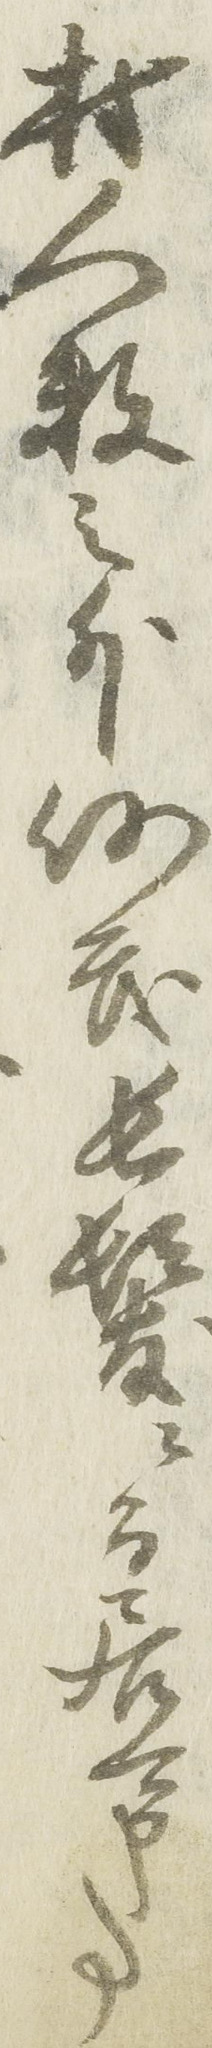村人数之外何も長髪ニ而居可申事
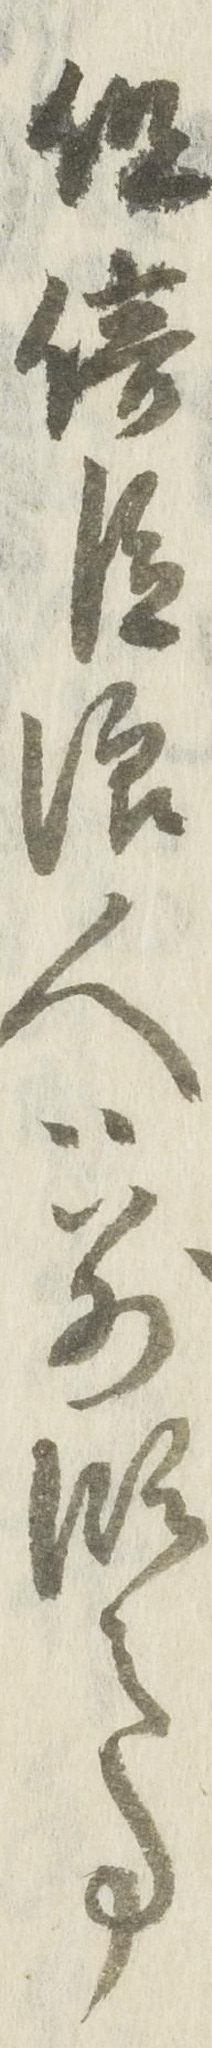但倍臣浪人は別段之事
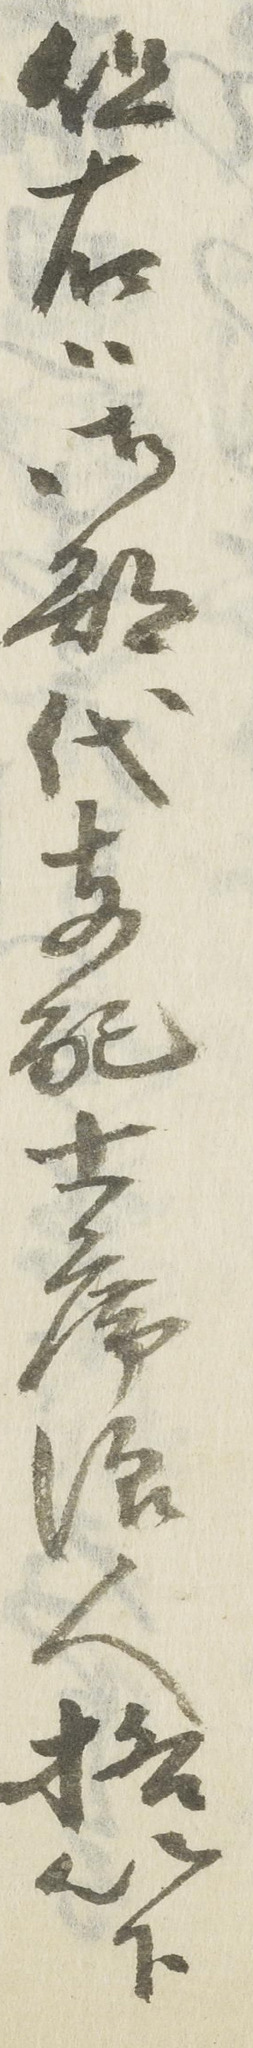但右は御郡代支配士席浪人格以下
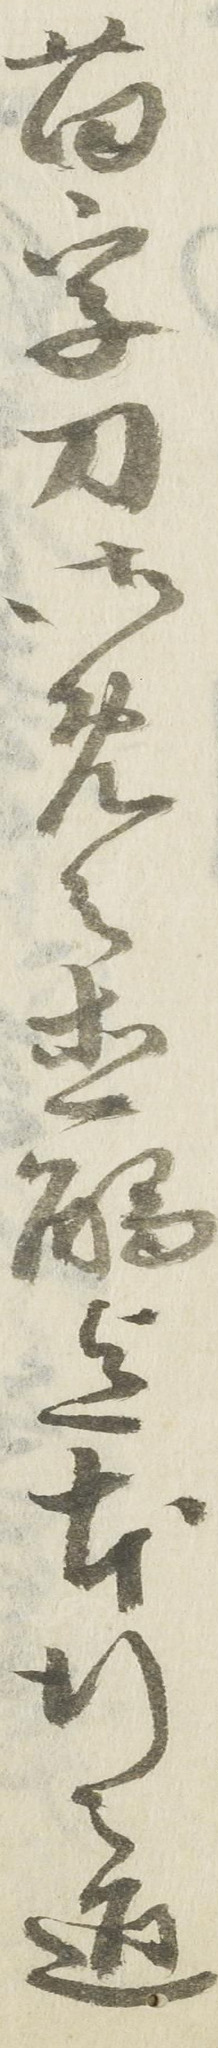苗字刀御免之直触迄本行之通
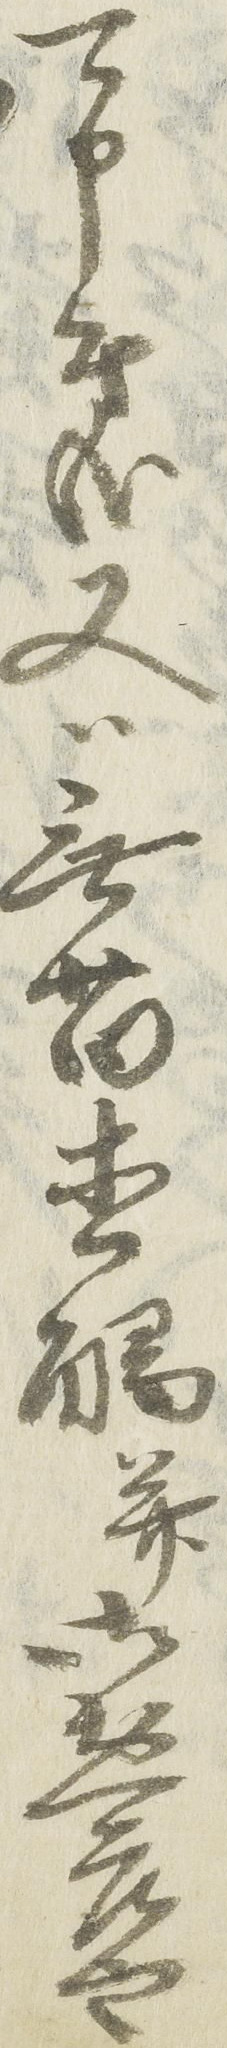可申付哉又は無苗直触并御惣庄や
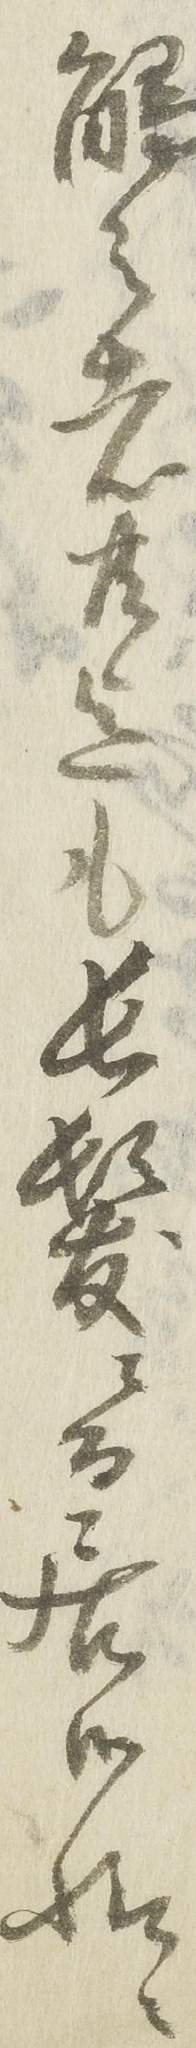触之者共迄も長髪ニ而居候様ニ
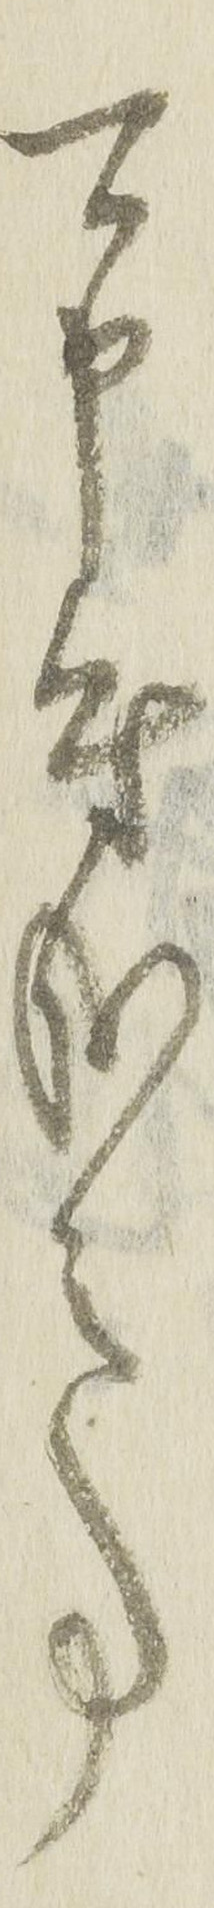可申付哉之事

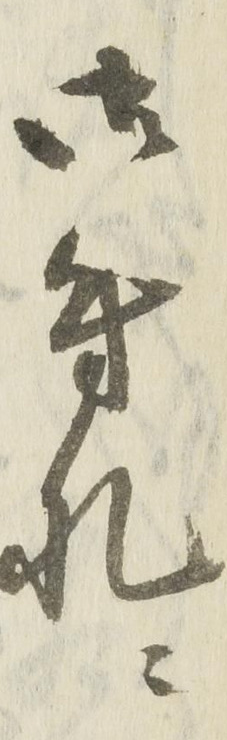御付札ニ
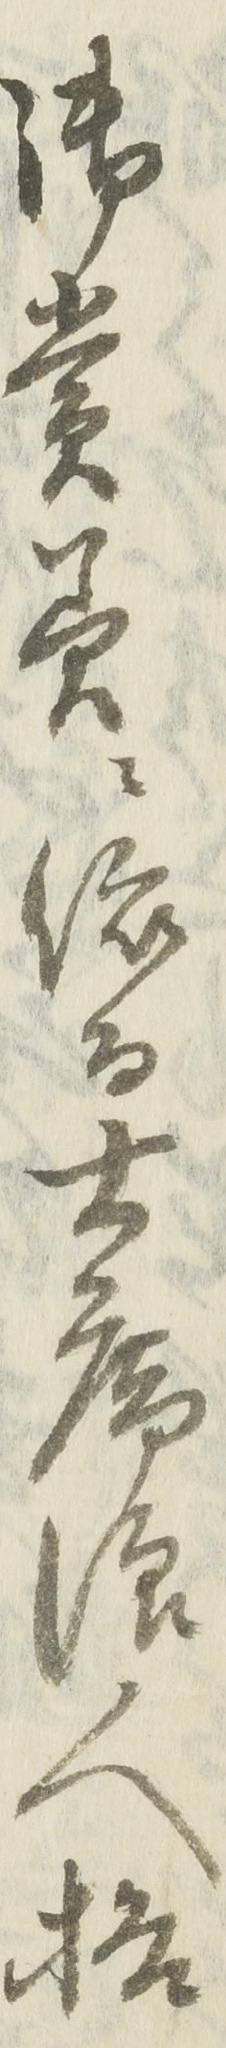御賞美ニ依而士席浪人格
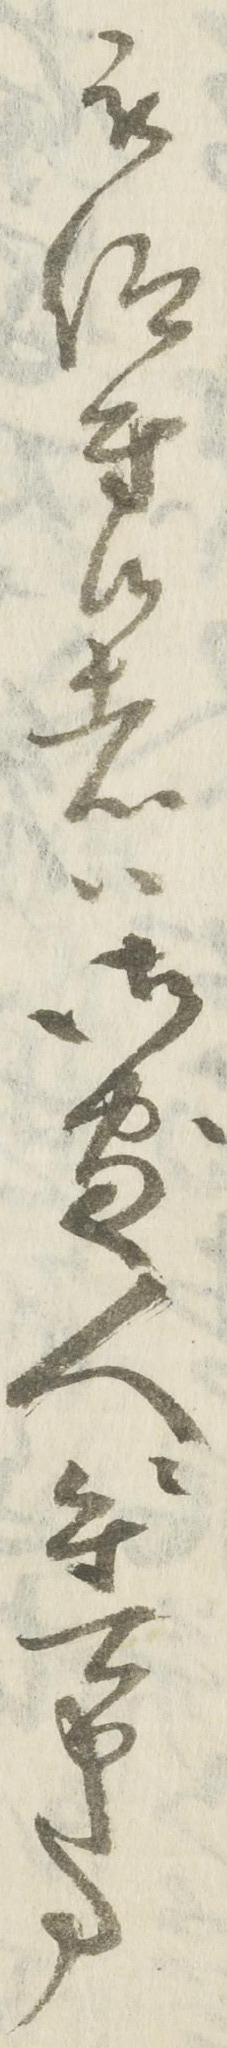被仰付候者は御家人ニ付可申事
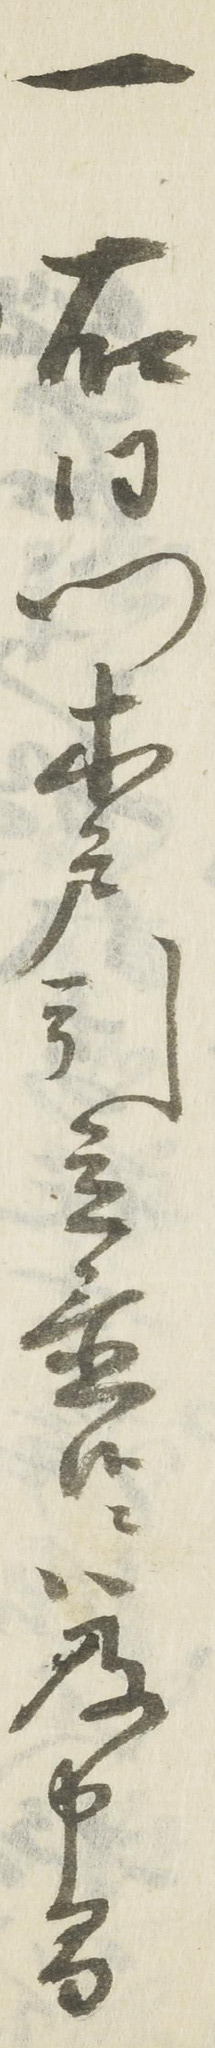一右同門木戸引立置候ニは及申間
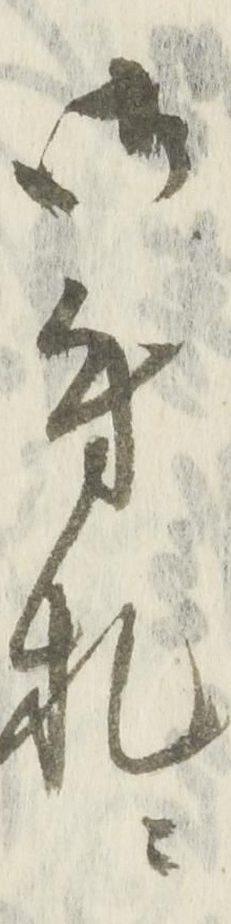御付札ニ
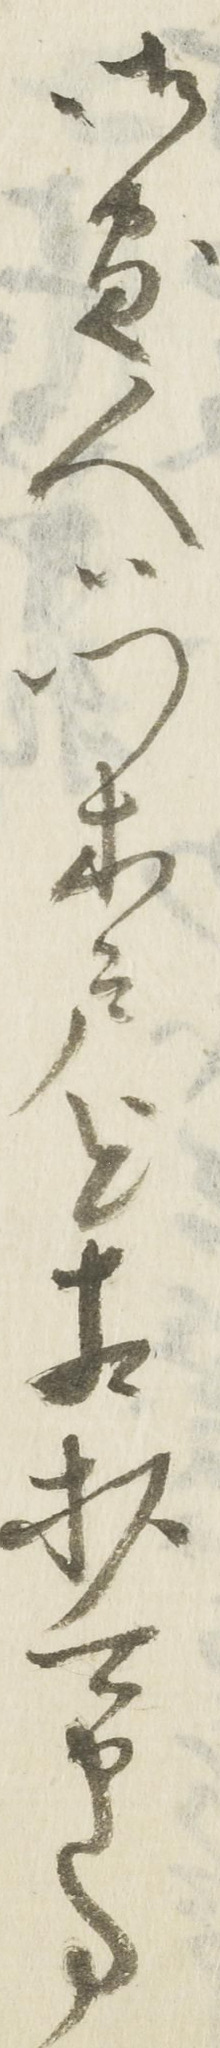御家人は門木戸を相扑可申事
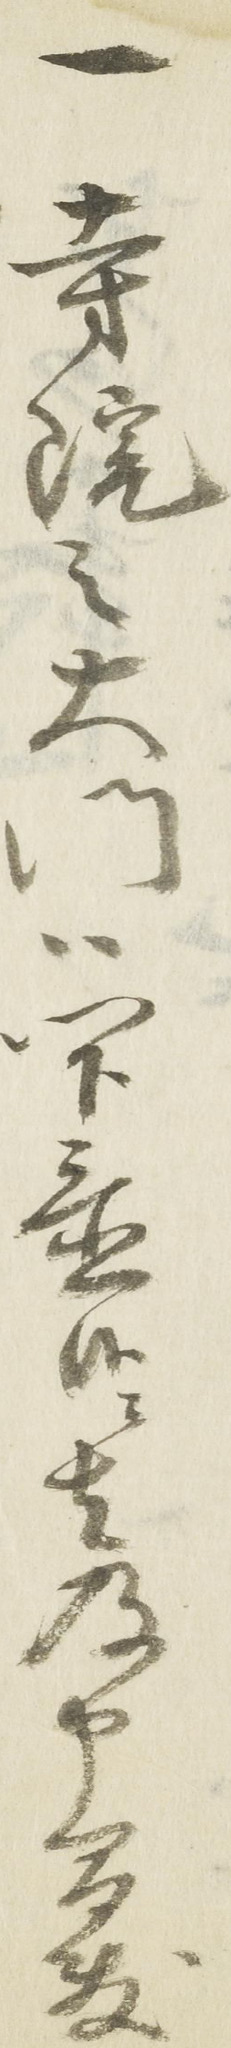一寺院之大門は閉置候ニは及申間敷
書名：後見笑
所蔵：東京大学地震研究所図書室 Earthquake Research Institute Library, The University of Tokyo, JAPAN
